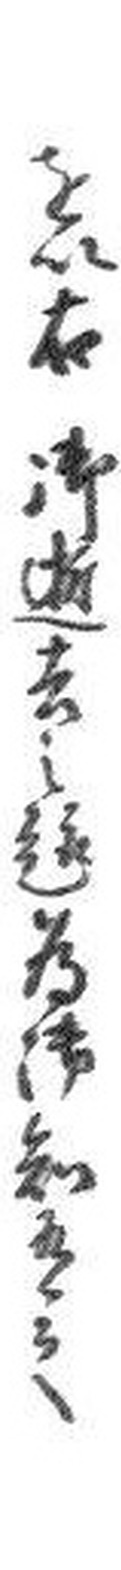を以右御逝去之趣為御知有之
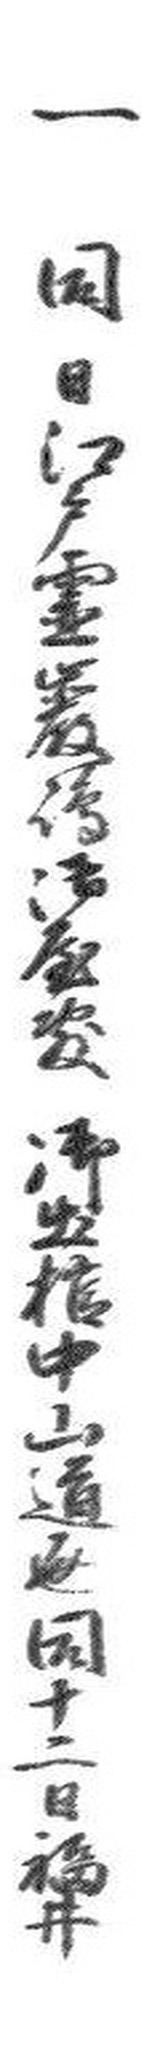一同日江戸霊巌島御屋敷御出棺中山道通同十二日福井
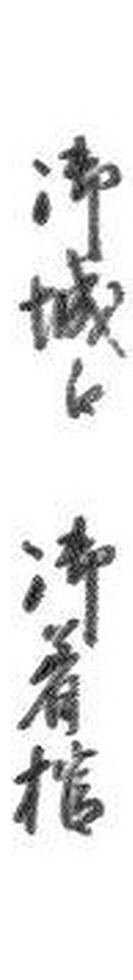御城江御着棺
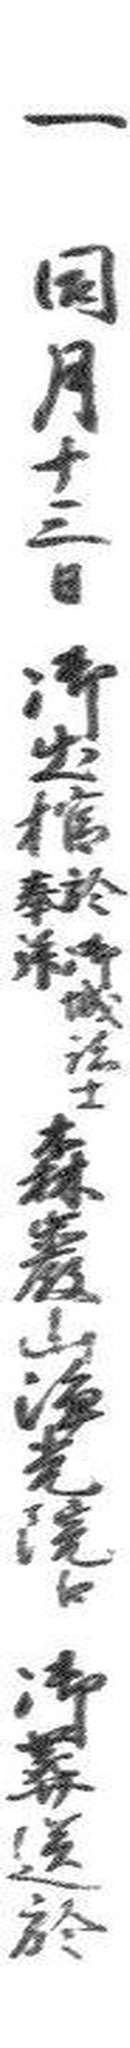一同月十三日御出棺於御城諸士奉拝森巌山浄光院江御葬送於
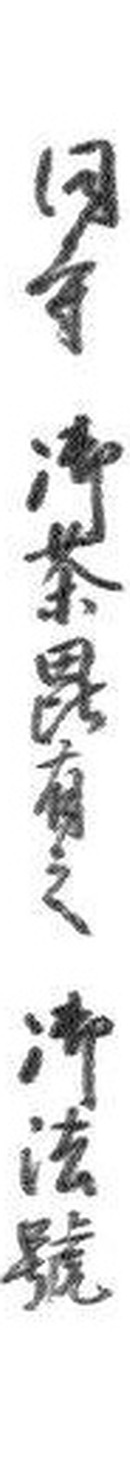同寺御荼毘有之御法号
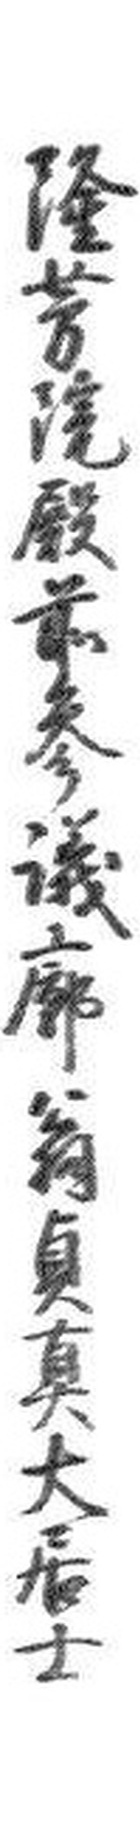隆芳院殿前参議廓翁貞真大居士

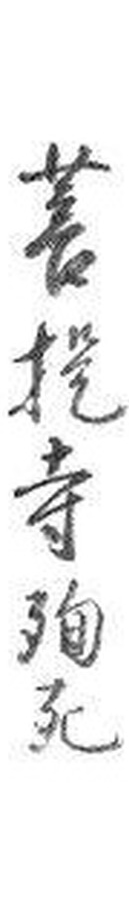菩提寺殉死
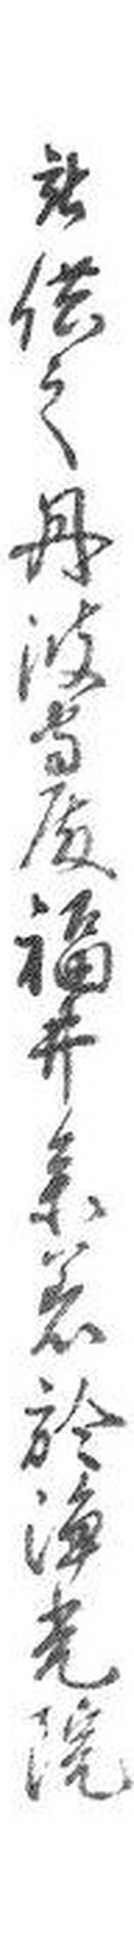被供之丹波守殿福井参着於浄光院
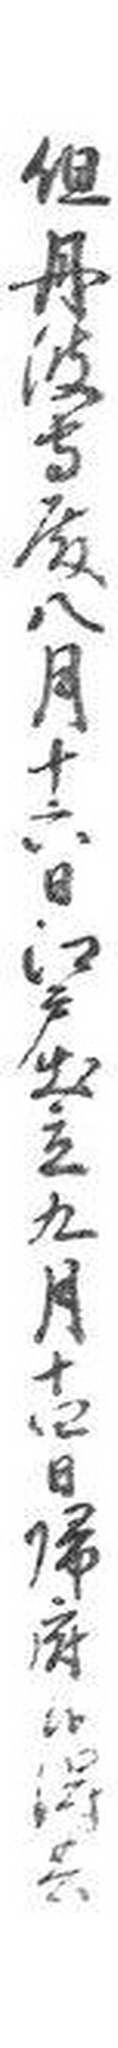但丹波守殿八月十六日江戸出立九月十四日帰府候得共
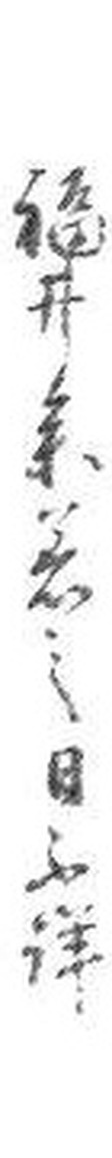福井参着之日不詳
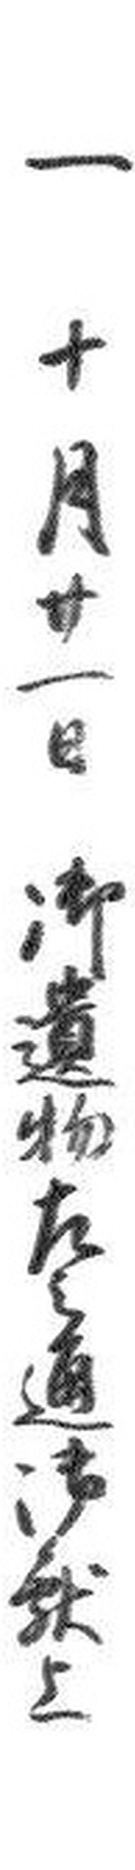一十月廿一日御遺物左之通御献上
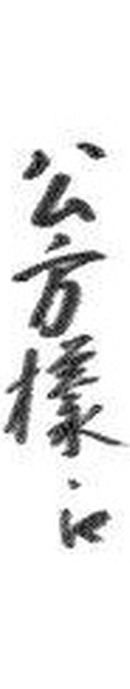公方様江
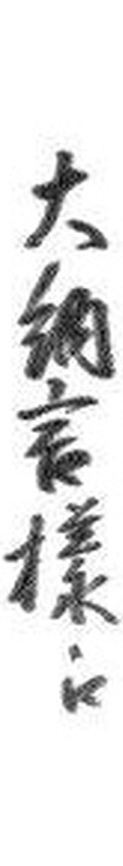大納言様江
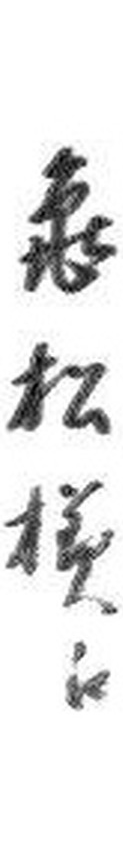亀松様江

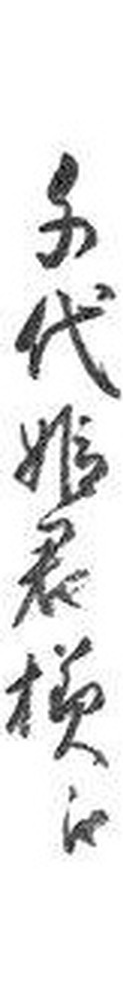千代姫君様江
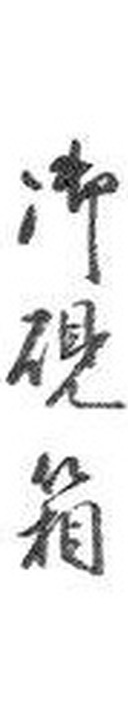御硯箱
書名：家譜 四 忠昌公 従寛永七年到正保四年
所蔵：福井県文書館 Fukui Prefectural Archives
